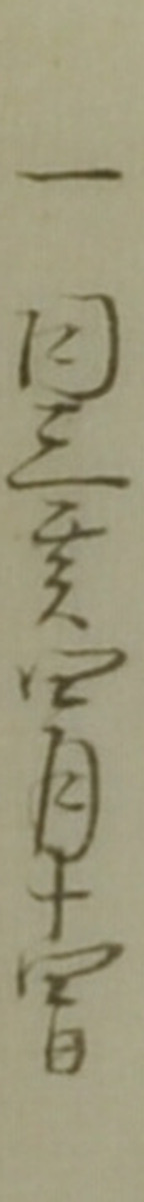一同三亥四月十四日
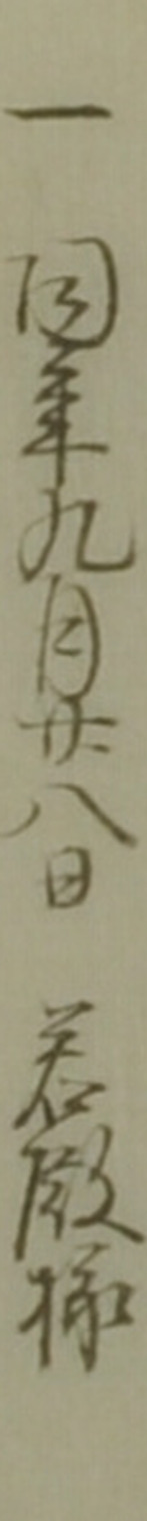一同年九月廿八日若殿様
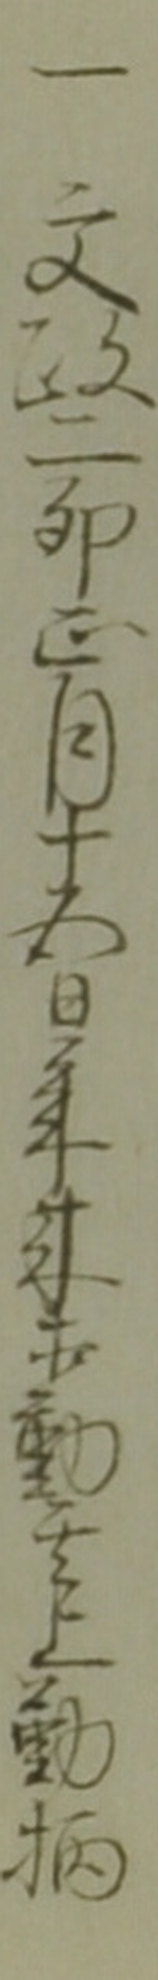一文政二卯正月十五日年来相勤其上勤柄
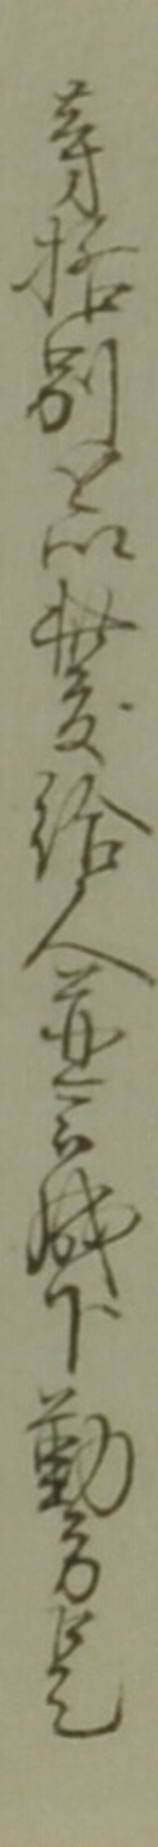旁格別を以此度給人並被成下勤方是

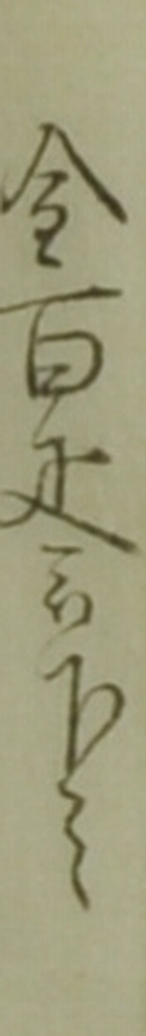金百疋被下之
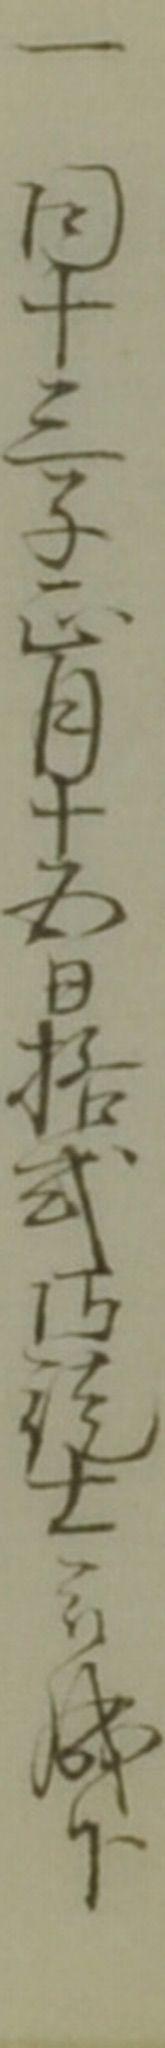一同十三子正月十五日格式御徒士被成下
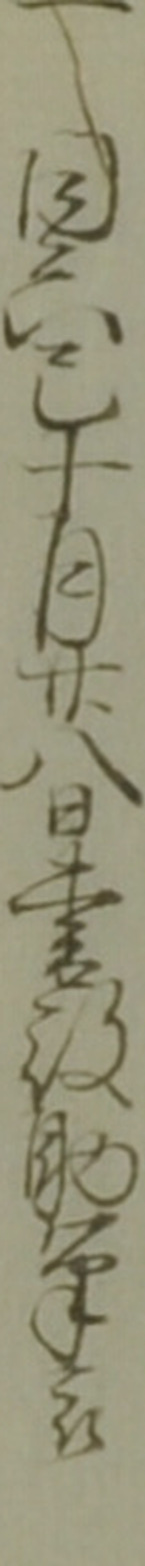一同六巳十月廿八日書役助筆被
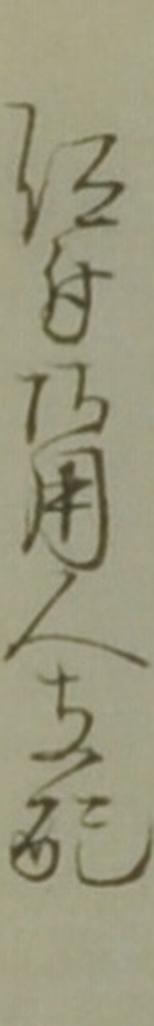仰付御用人支配
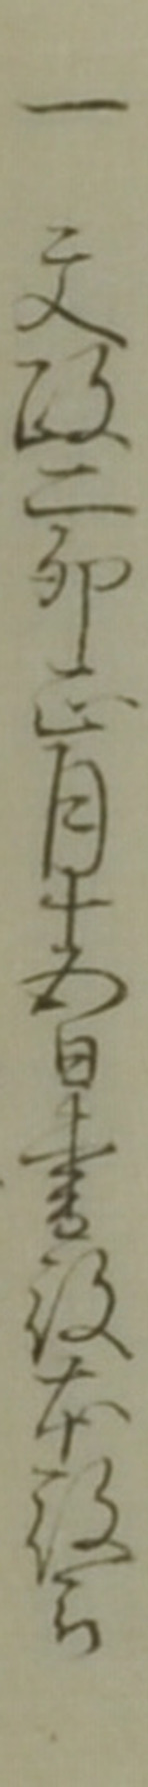一文政二卯正月十五日書役本役被
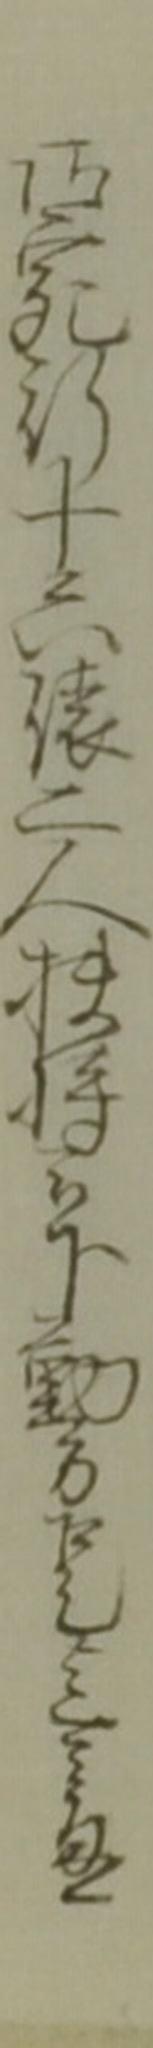御宛行十六俵二人扶持被下勤方是迄之通
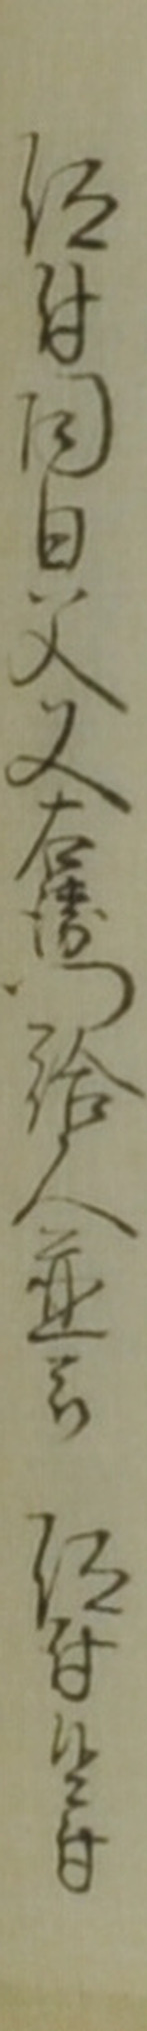仰付同日父又右衛門給人並被仰付候ニ付

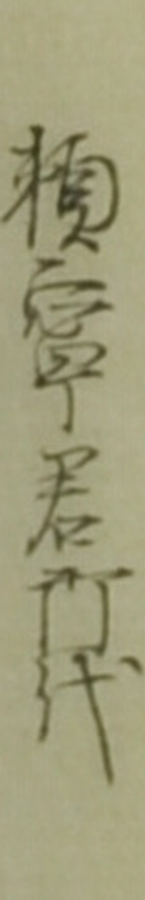頼寧君御代
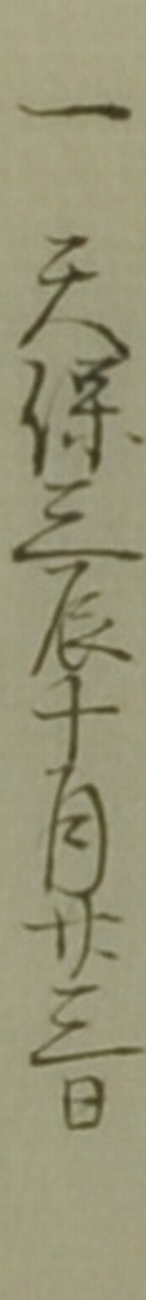一天保三辰十月廿三日
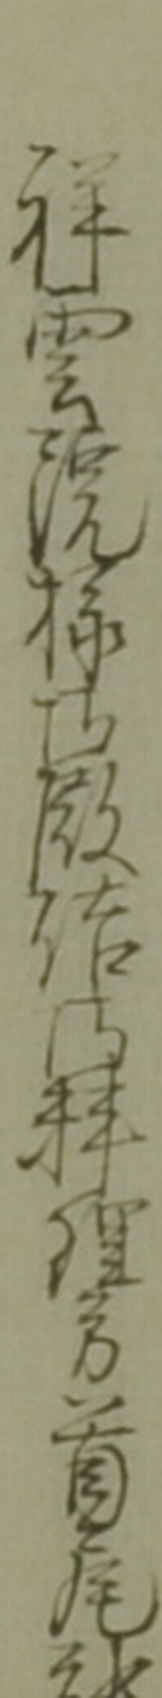祥雲院様御殿詰御料理方首尾能
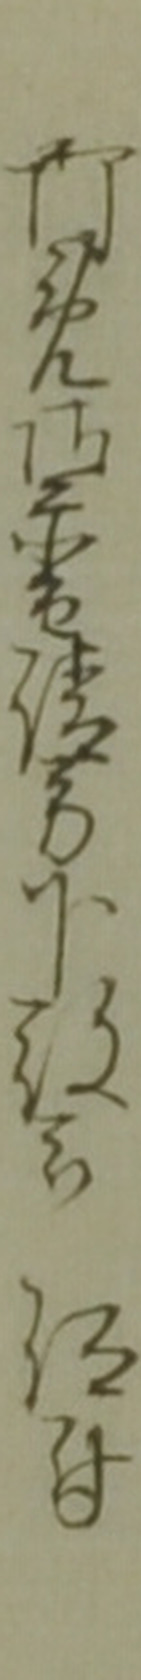御免御普請方下役被仰付
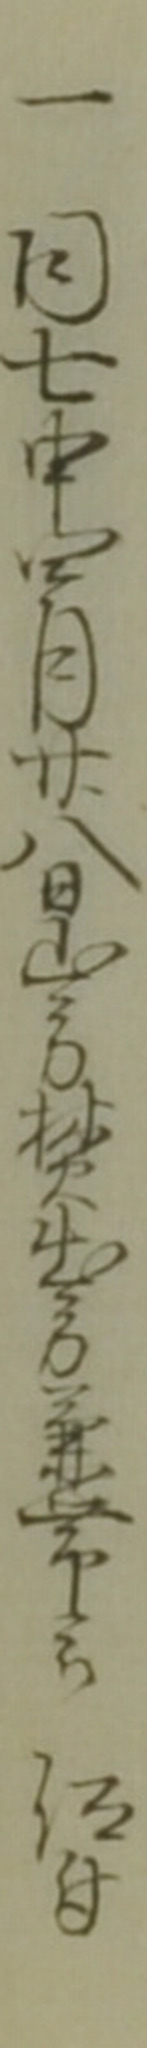一同七申四月廿八日山方焚出方兼帯被仰付
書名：無足諸士勤仕録（一）
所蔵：伊那市立高遠町図書館・合同会社AMANE
